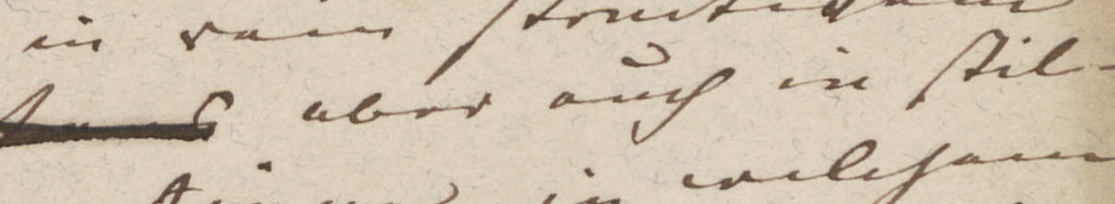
zweitens aber auch in stil-
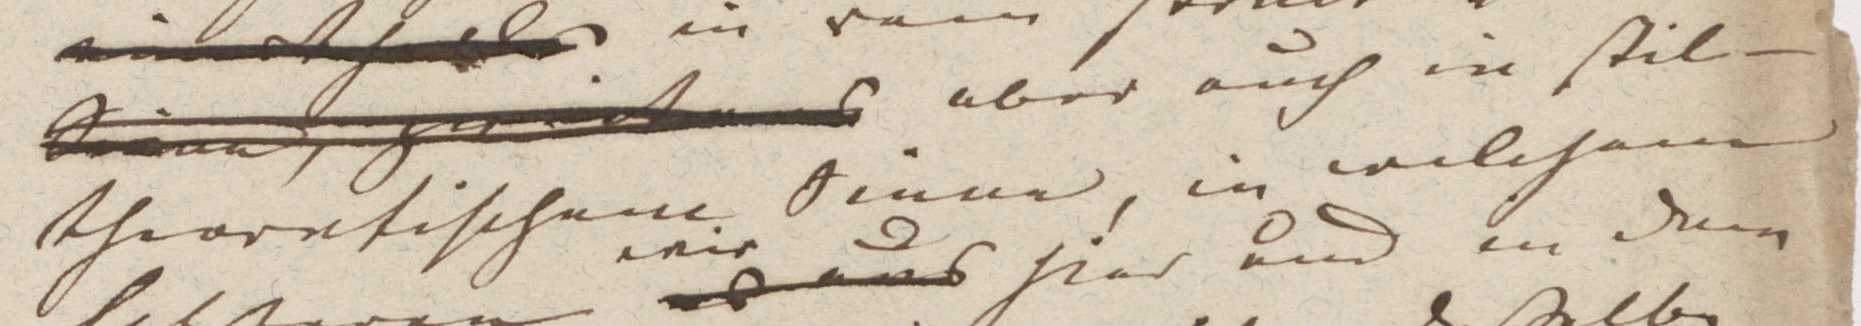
theoretischem Sinne, in welchem
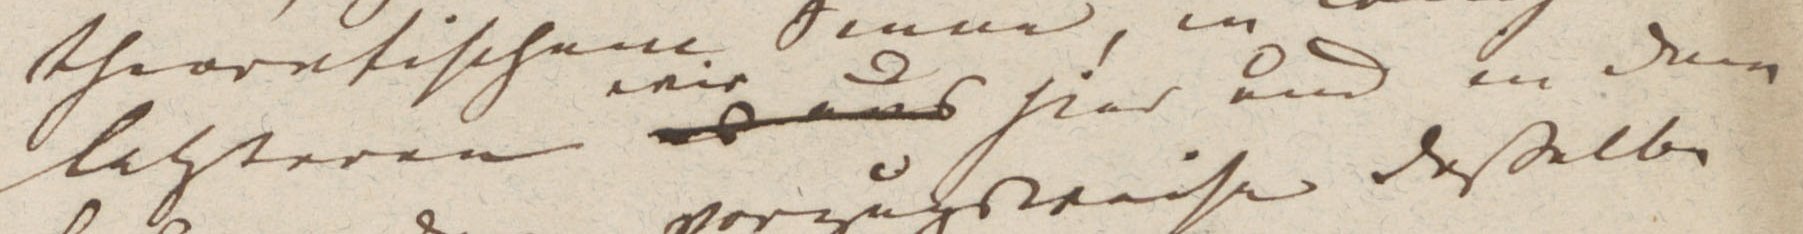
letzteren es uns wir hier und in dem
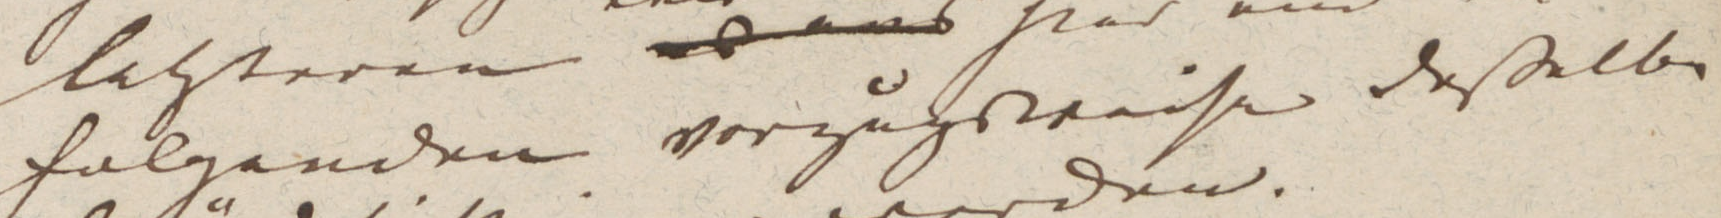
Folgenden vorzugsweise dasselbe
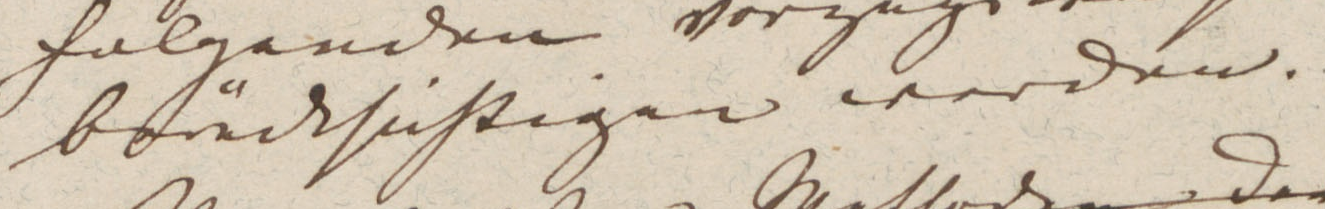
berücksichtigen werden.
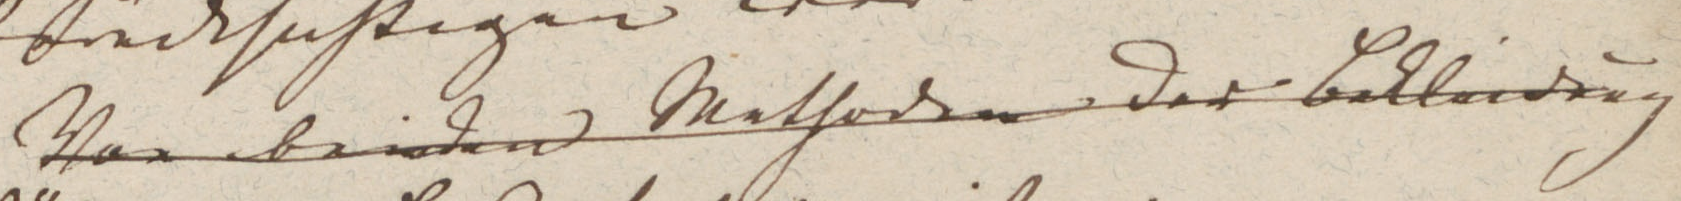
Von beiden Methoden der Bekleidung
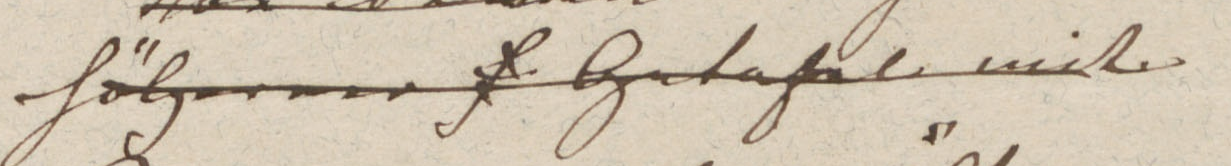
hölzerner F Getafel mit
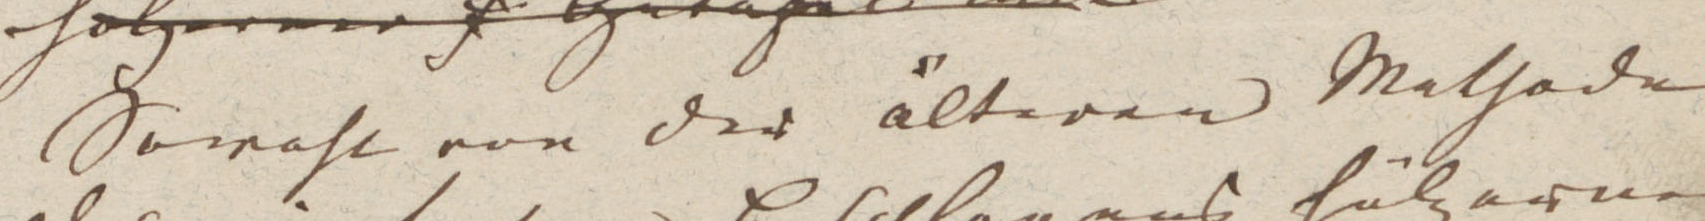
Sowohl von der älteren Methode
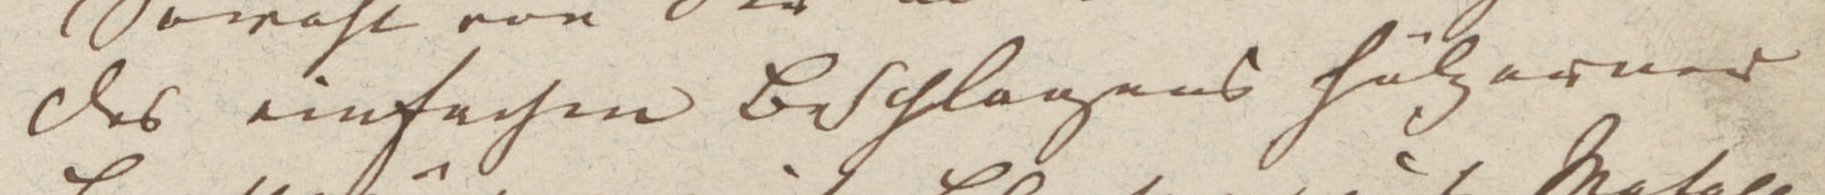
des einfachen Beschlagens hölzerner
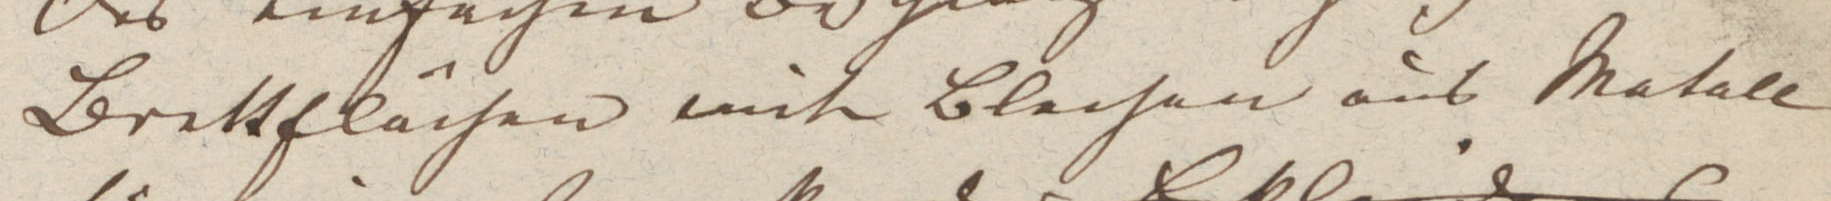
Brettflächen mit Blechen aus Metall
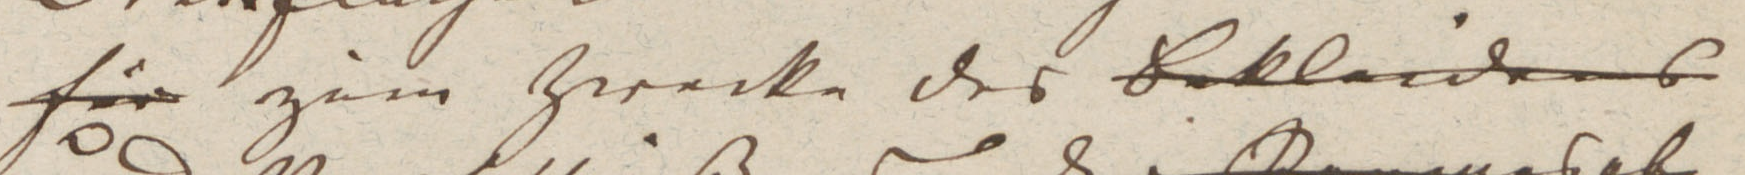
für zum Zwecke des Bekleidens
